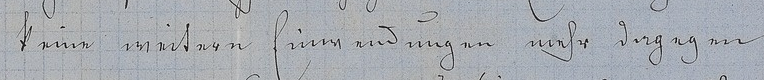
keine weitern Einwendungen mehr dagegen
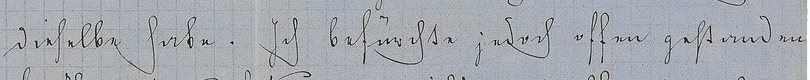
dieselbe habe. Ich befinde jedoch offen gestanden
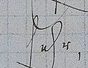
sehr,
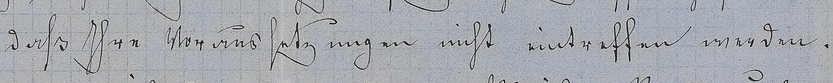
daß Ihre Voraussetzungen nicht eintreffen werden.
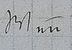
Wenn
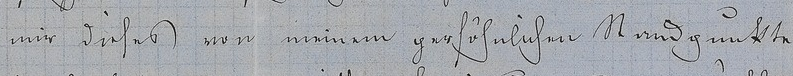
mir dieses von meinem persöhnlichen Standpunkte
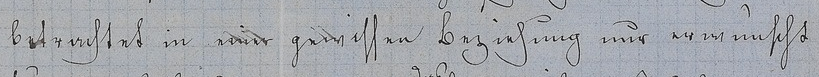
betrachtet in einer gewissen Beziehung nur erwünscht
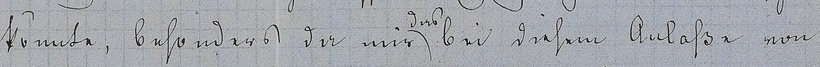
könnte, besonders da mir das bei diesem Anlaße von
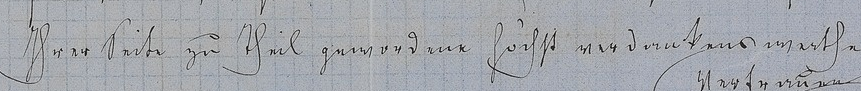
Ihrer Seite zu Theil gewordene höchst verdankenswerthe
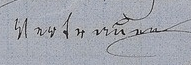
Vertrauen
